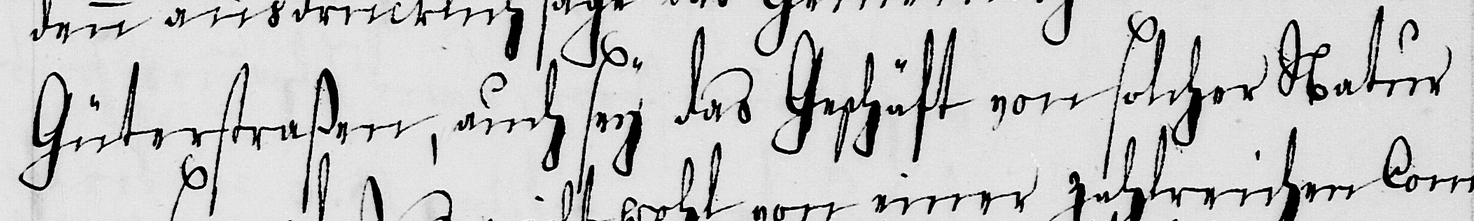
Güterstraßen, auch sey das Geschäft von solcher Natur
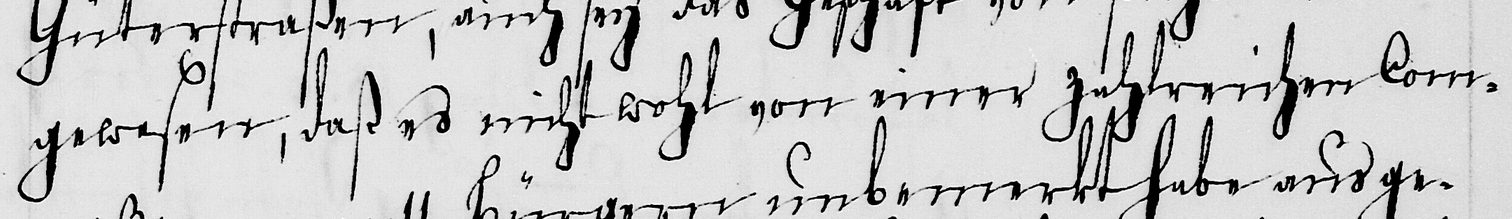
gewesen, daß es nicht wohl von einer zahlreichen Com¬
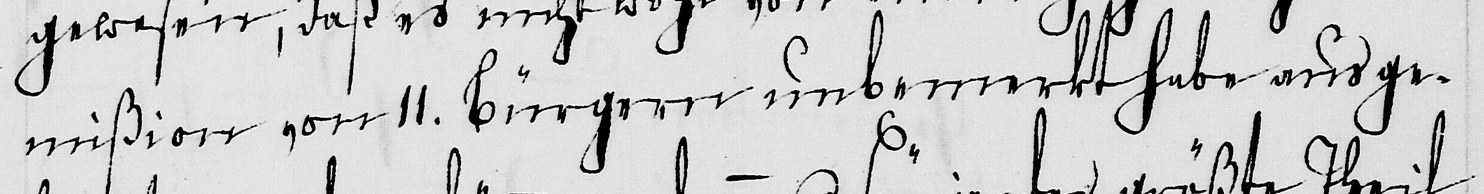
mißion von 11. Bürgern unbemerkt habe ausge¬
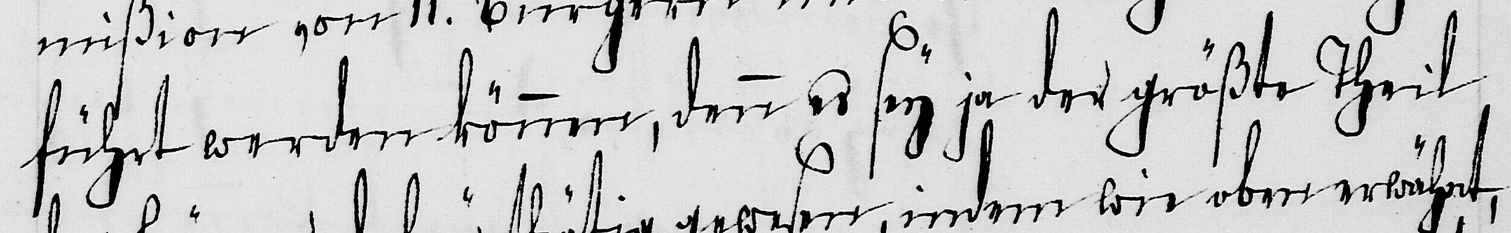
führt werden können, denn es sey ja der größte Theil
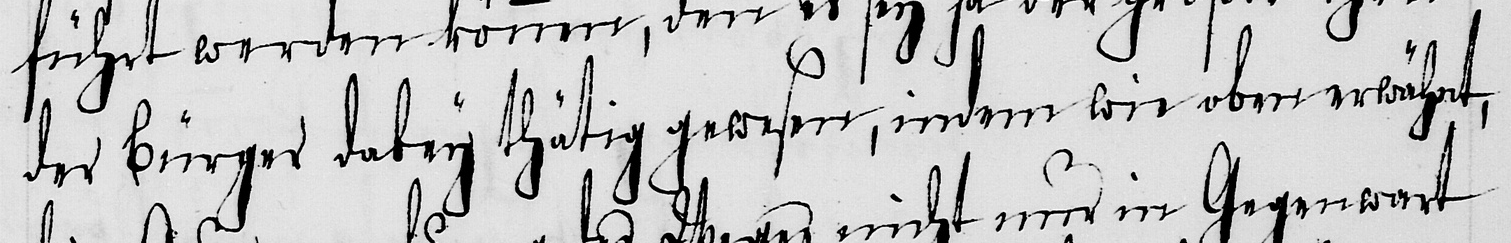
der Bürger dabey thätig gewesen, indem wie oben erwähnt,
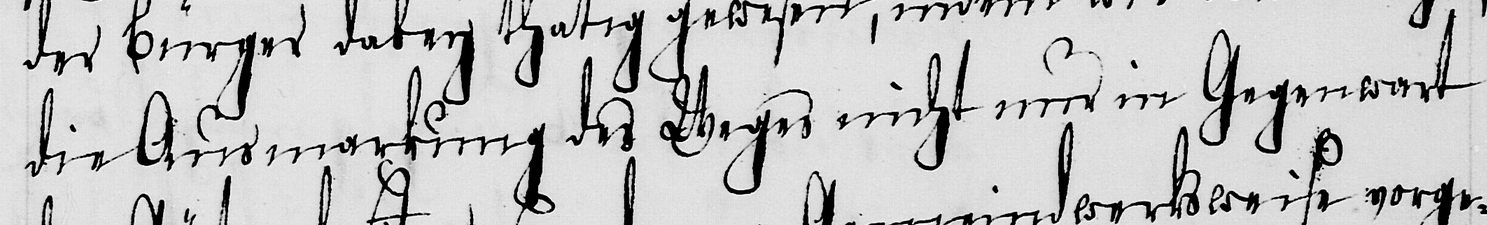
die Ausmarkung des Weges nicht nur in Gegenwart
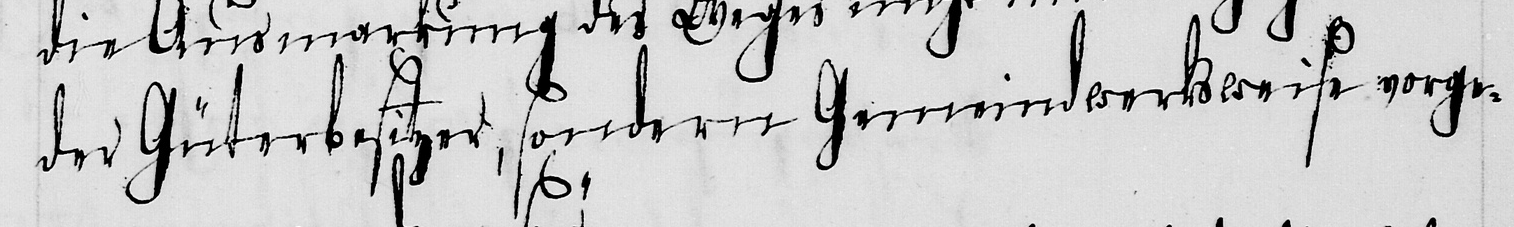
der Güterbesitzer, sondern Gemeindswerksweise vorge¬
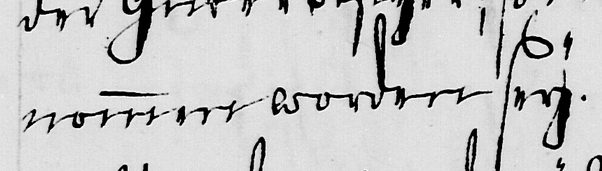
nommen worden sey.
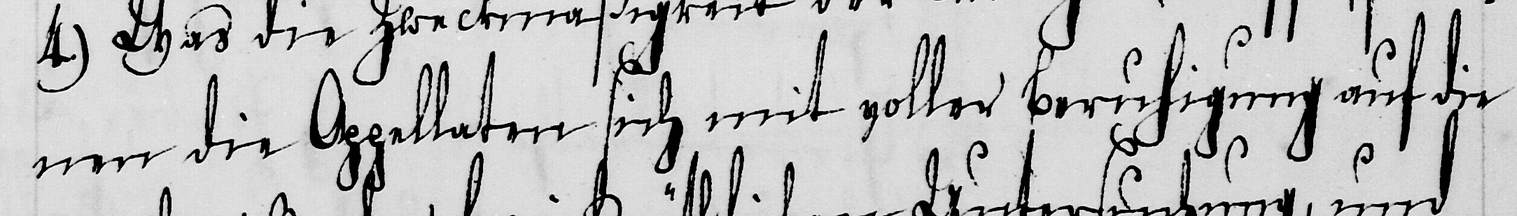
nen die Appelaten sich mit voller Beruhigung auf die
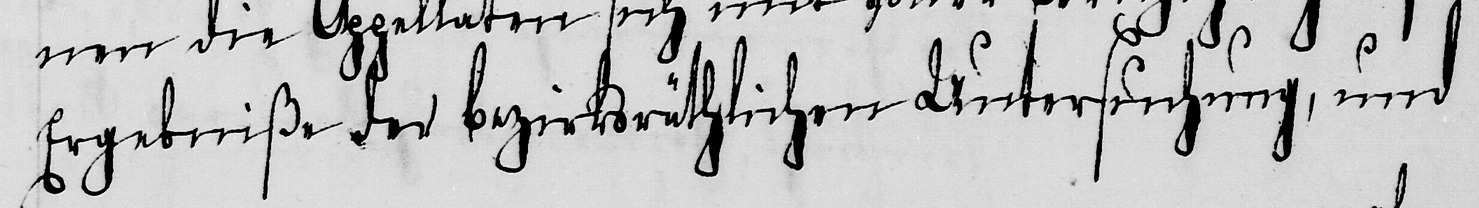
Ergebniße der bezirksräthlichen Untersuchung, und
